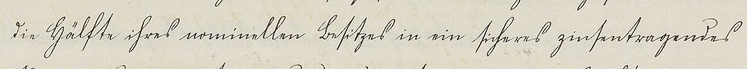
die Hälfte ihres nominellen Besitzes in ein sicheres zinsentragendes
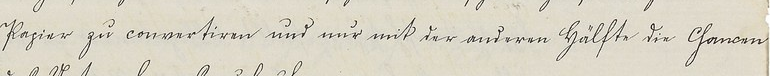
Papier zu convertiren und nur mit der anderen Hälfte die Chancen
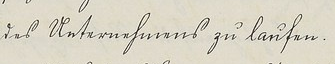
des Unternehmens zu laufen.
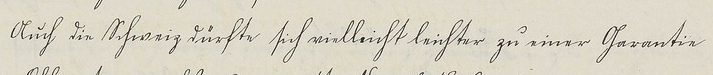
Auch die Schweiz dürfte sich vielleicht leichter zu einer Garantie
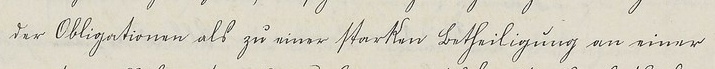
der Obligationen als zu einer starken Betheiligung an einer
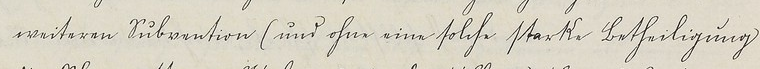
weiteren Subvention (und ohne eine solche starke Betheiligung
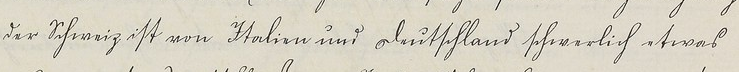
der Schweiz ist von Italien und Deutschland schwerlich etwas
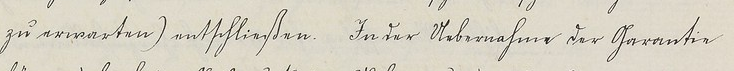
zu erwarten) entschließen. In der Uebernahme der Garantie
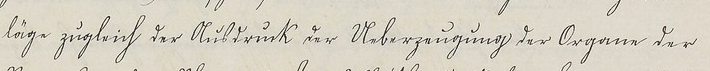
läge zugleich der Ausdruck der Ueberzeugung der Organe der
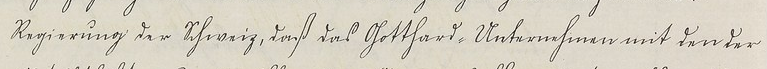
Regierung der Schweiz, daß das Gotthard-Unternehmen mit den der
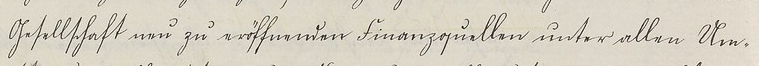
Gesellschaft neu zu eröffnenden Finanzquellen unter allen Um-
